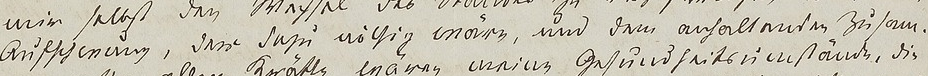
Aufschwung, der dazu nöthig wäre, und dem anhaltenden Zusam-
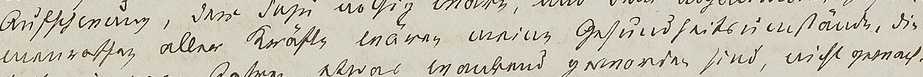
menraffen aller Kräfte wären meine Gesundheitsumstände, die
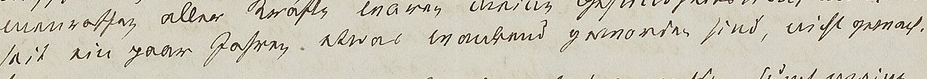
seit ein paar Jahren etwas wankend geworden sind, nicht gewach-
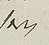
sen.
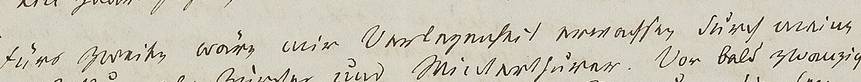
Fürs zweite wäre mir Verlegenheit erwachsen durch meine
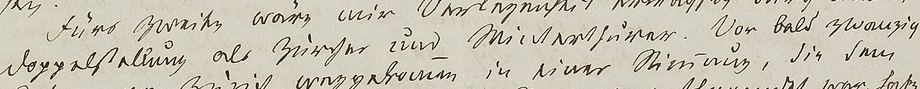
Doppelstellung als Zürcher und Winterthurer. Vor bald zwanzig
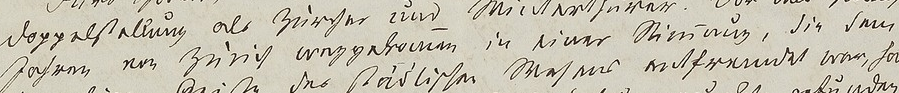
Jahren von Zürich weggekommen in einer Stimmung, die dem
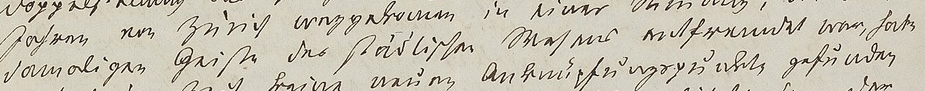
damaligen Geiste des städtischen Wesens entfremdet war, habe
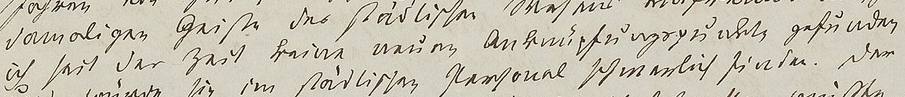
ich seit der Zeit keine neuen Anknüpfungspunkte gefunden
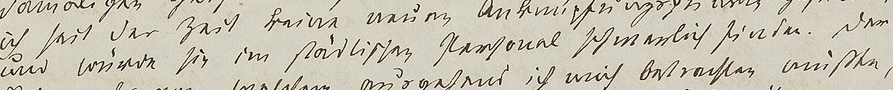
und würde sie im städtischen Personal schwerlich finden. Der
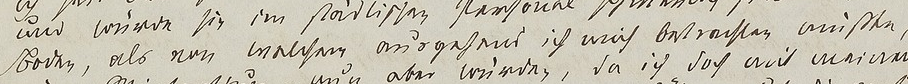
Boden, als von welchem ausgehend ich mich betrachten müßte,
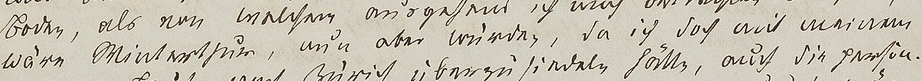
wäre Winterthur, nun aber würde, da ich doch mit meinem
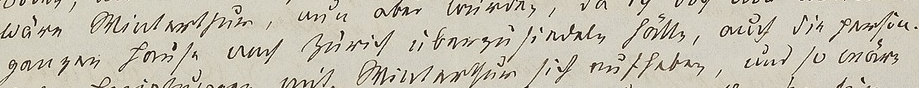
ganzen Hause nach Zürich überzusiedeln hätte, auch die persön-
